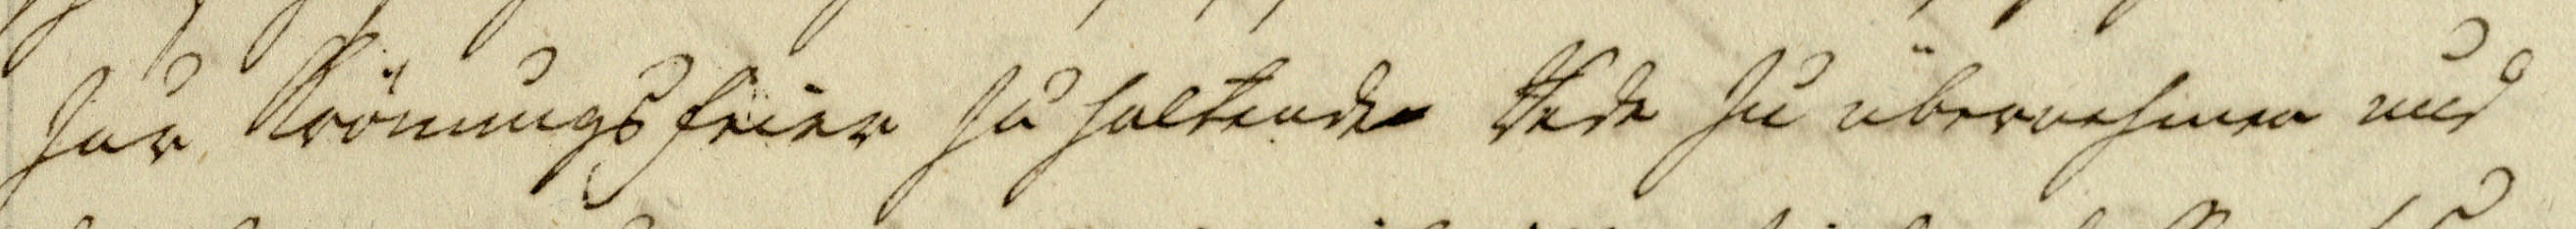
zur Krönungs feier zu haltende Rede zu übernehmen und
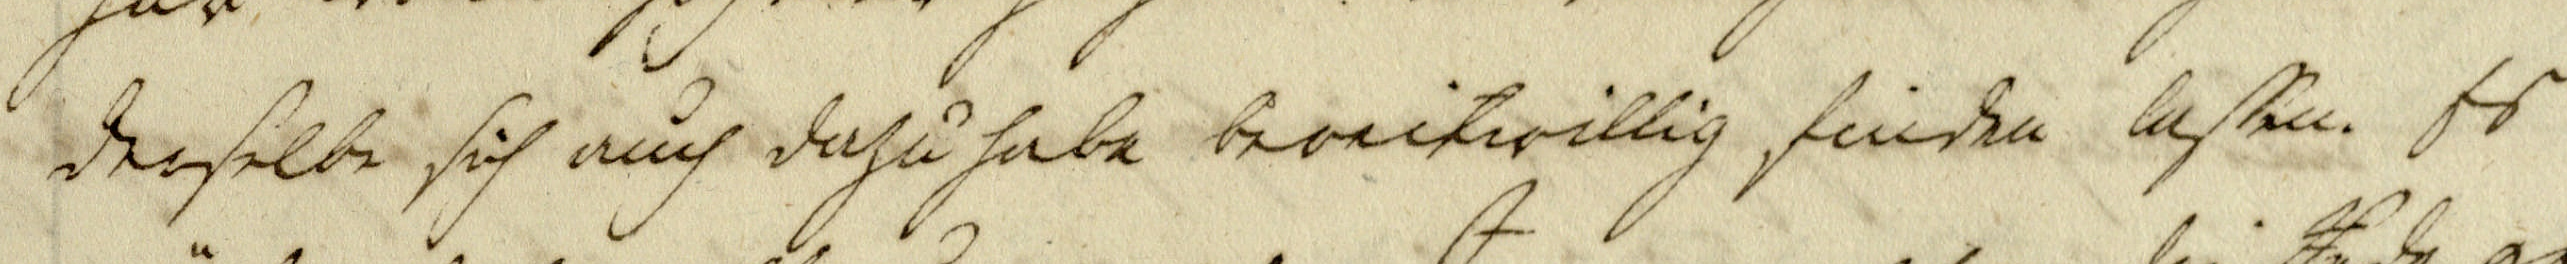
derselbe sich auch dazu habe bereitwillig finden lassen. Es
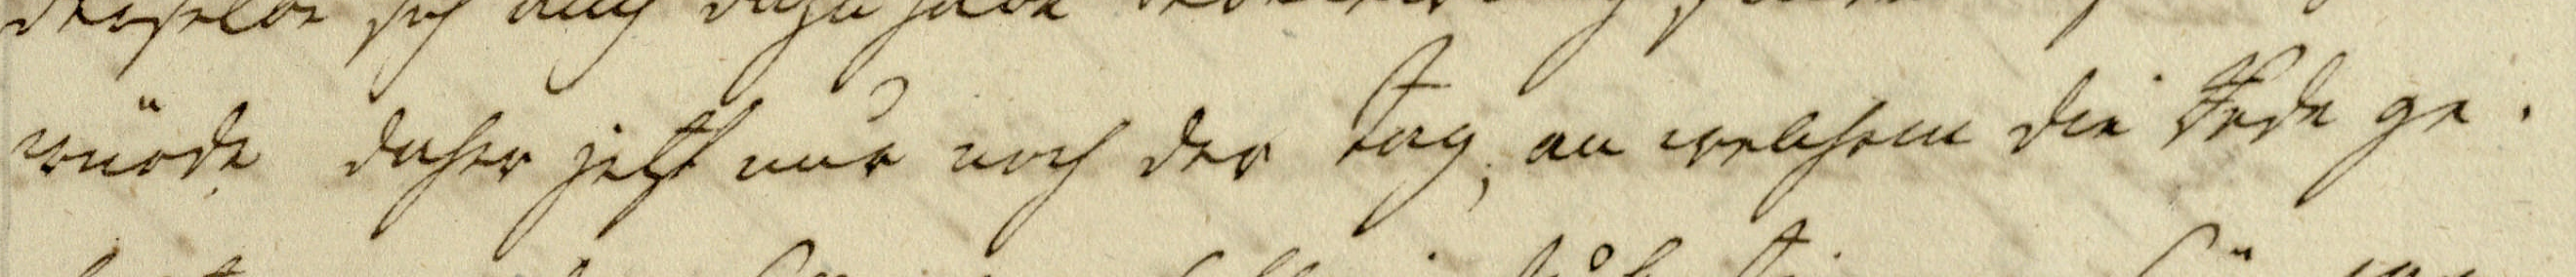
würde daher jetzt nur noch der Tag, an welchem die Rede ge¬
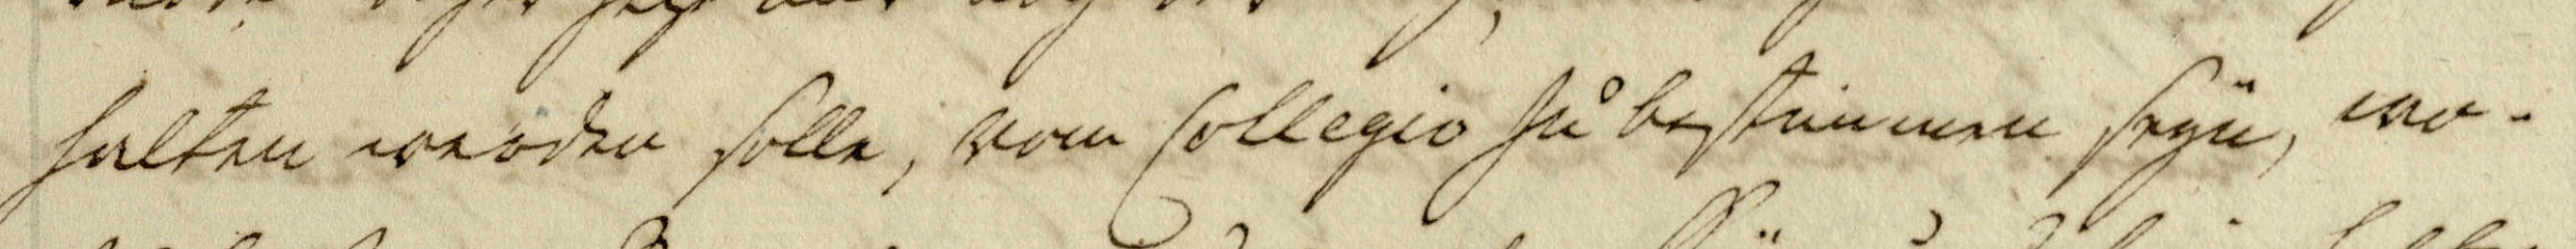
halten werden solle, vom Collegio zu bestimmen seÿn, wo¬
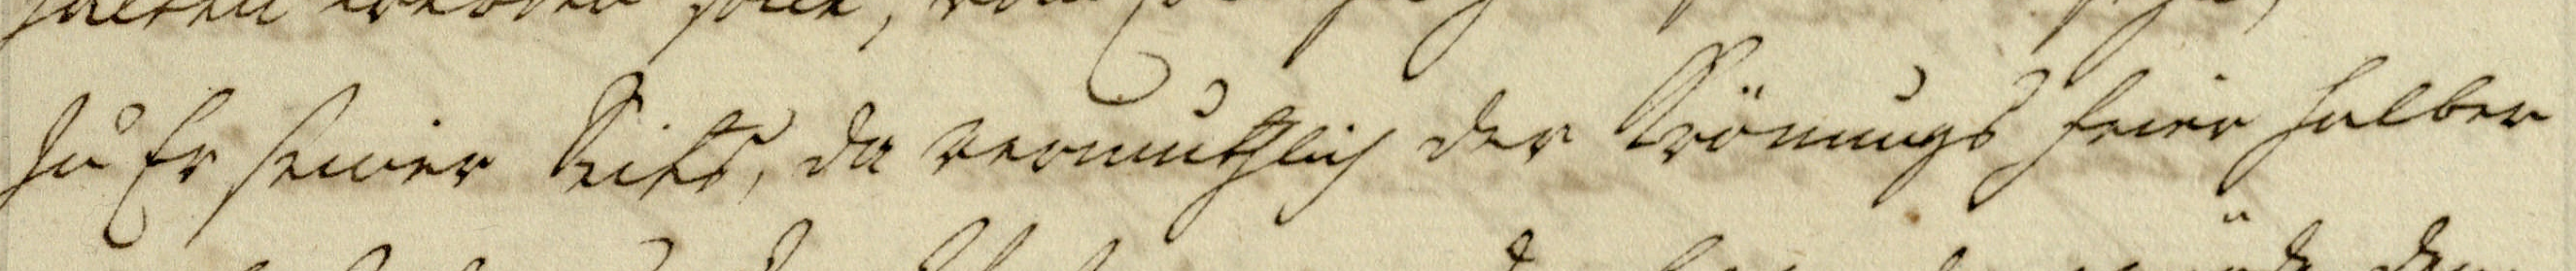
zu Er seiner Seits, da vermuthlich der Krönungs feier halber
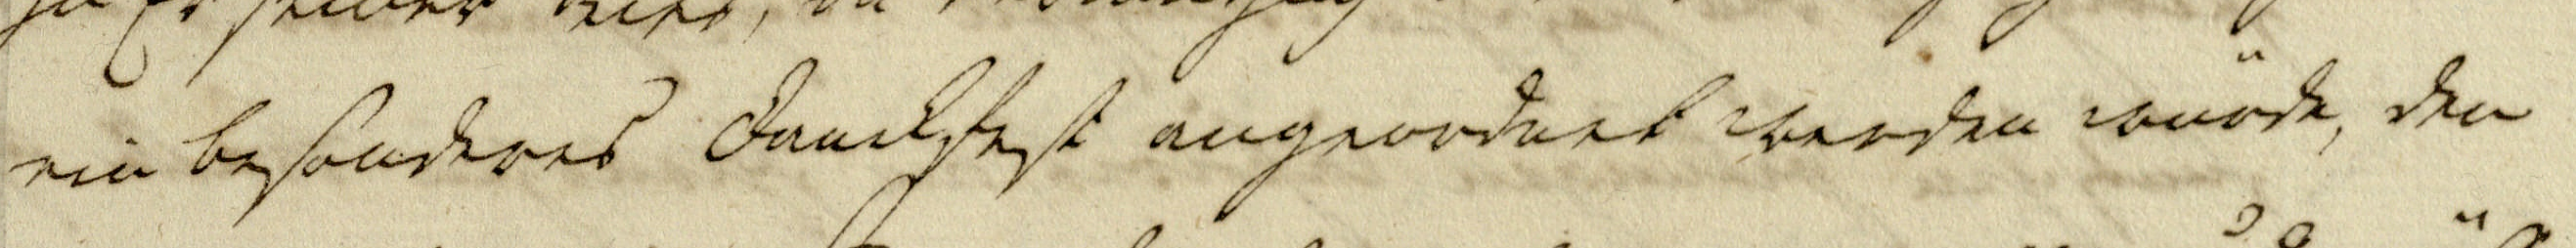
ein besonderes Danckfest angeordnet werden würde, den
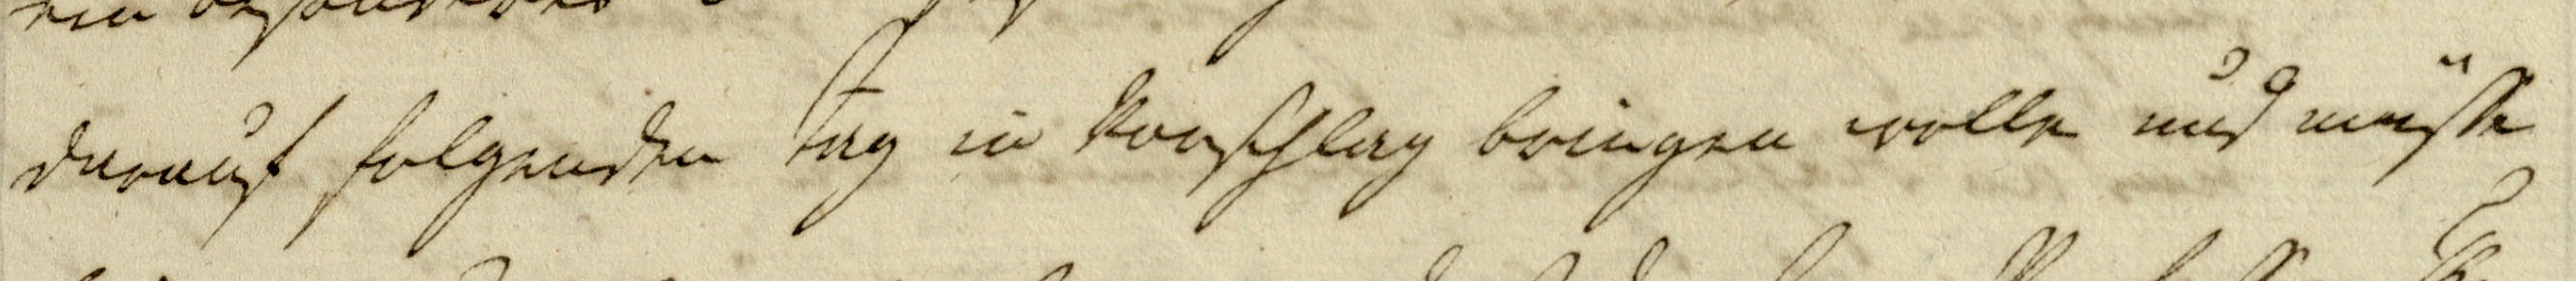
darauf folgenden Tag in Vorschlag bringen wolle und müsse
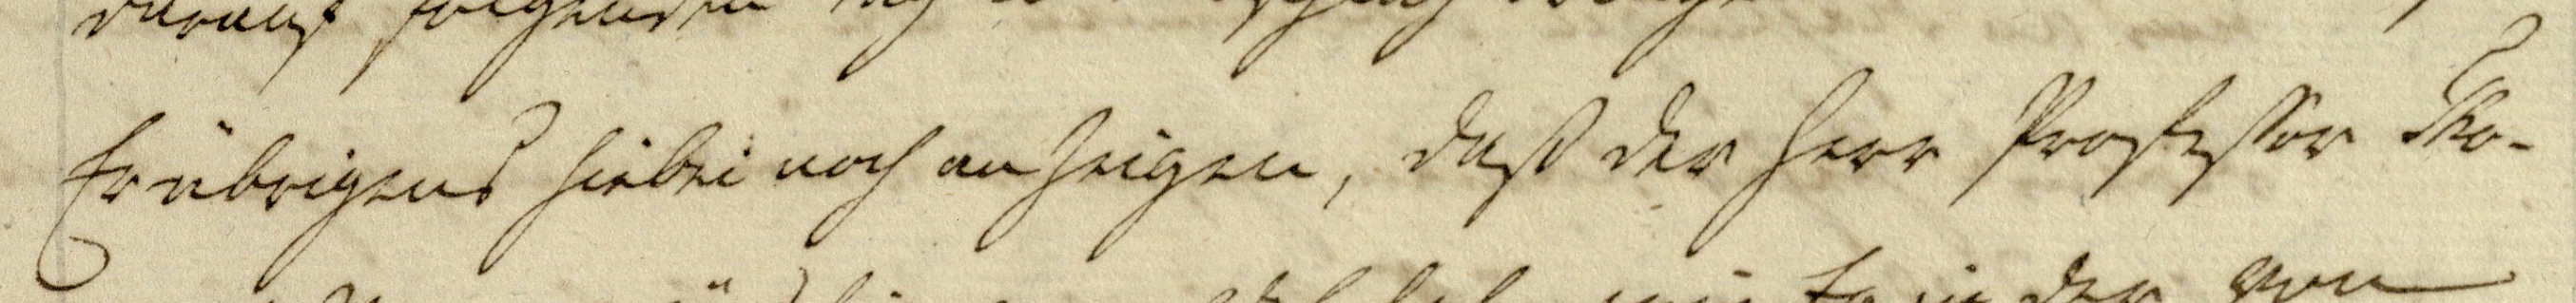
Er übrigens hiebei noch anzeigen, daß der Herr Professor Tho¬
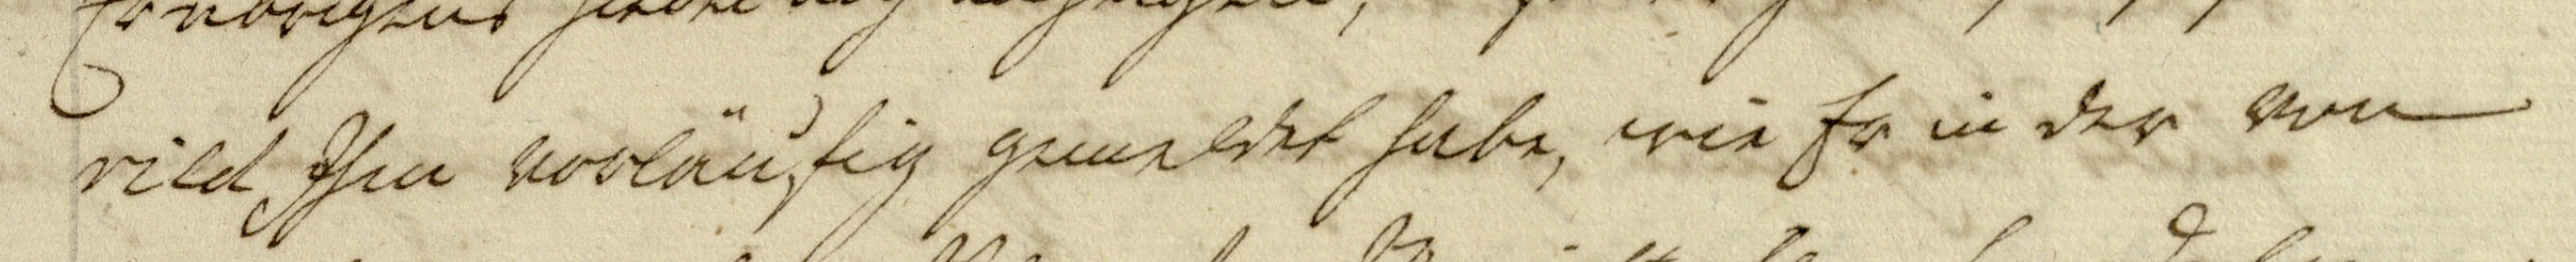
rild Ihm vorläufig gemeldet habe, wie Er in der von
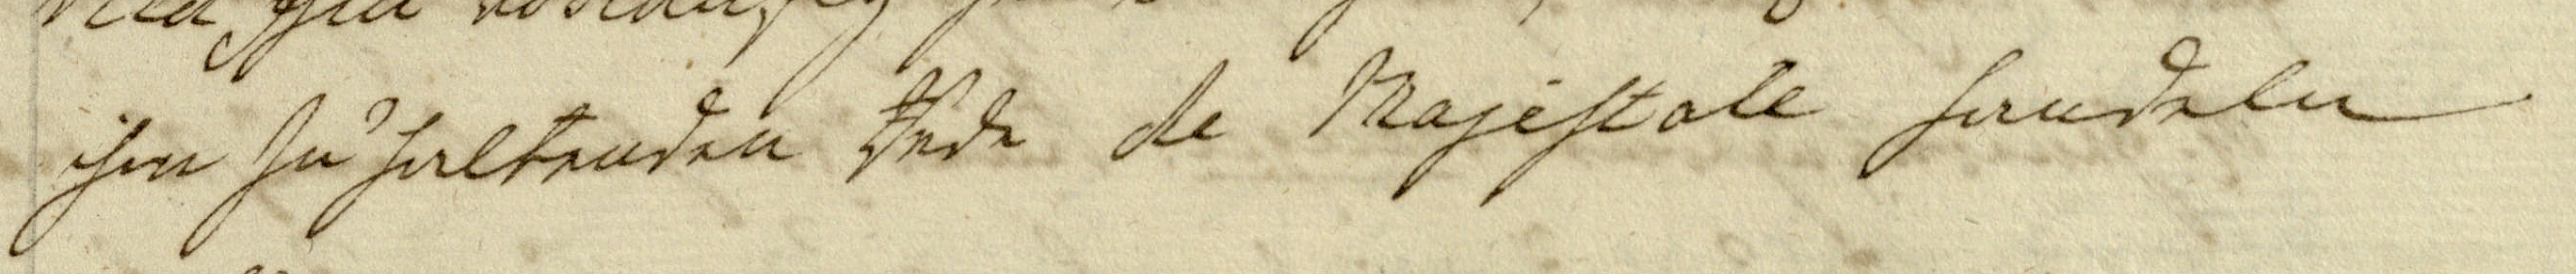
ihm zu haltenden Rede de Majestate handeln
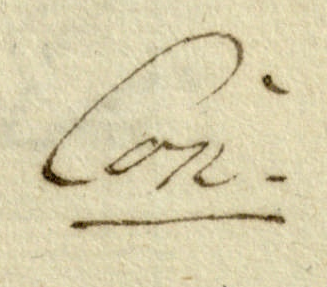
Con¬
